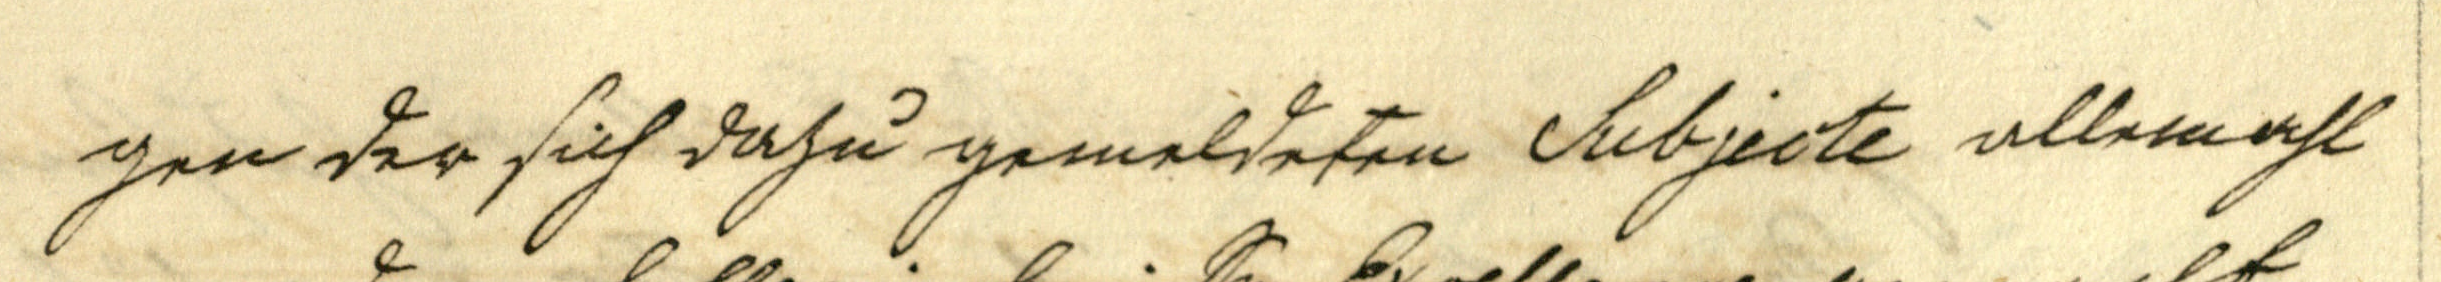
gen der sich dazu gemeldeten Subjecte allemahl
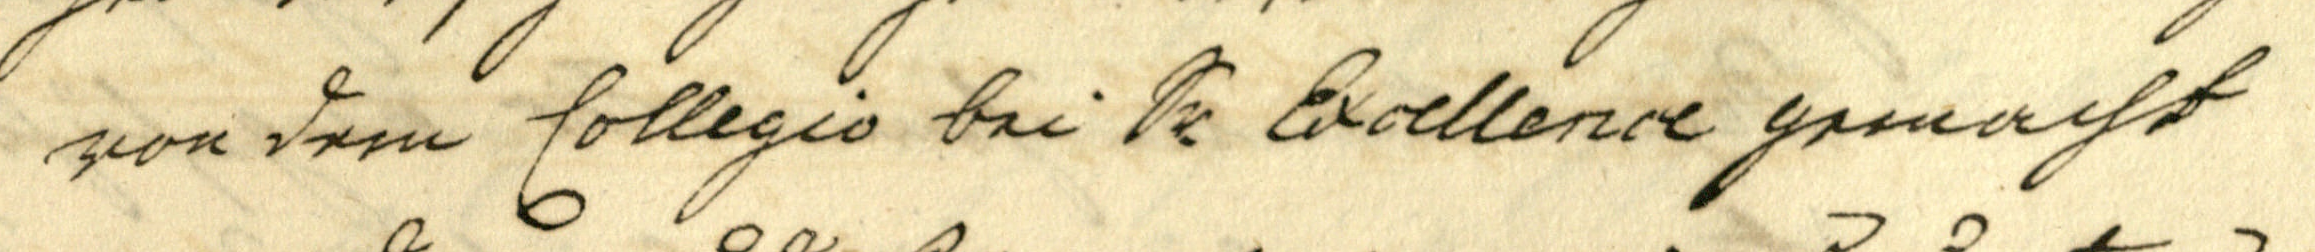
von dem Collegio bei Sr Excellence gemacht
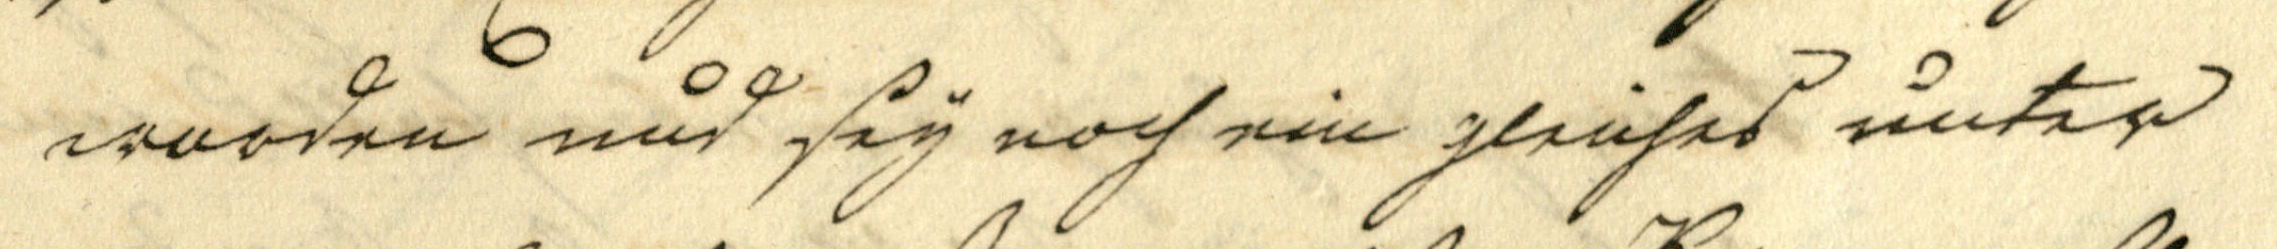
worden und seÿ noch ein gleiches unter
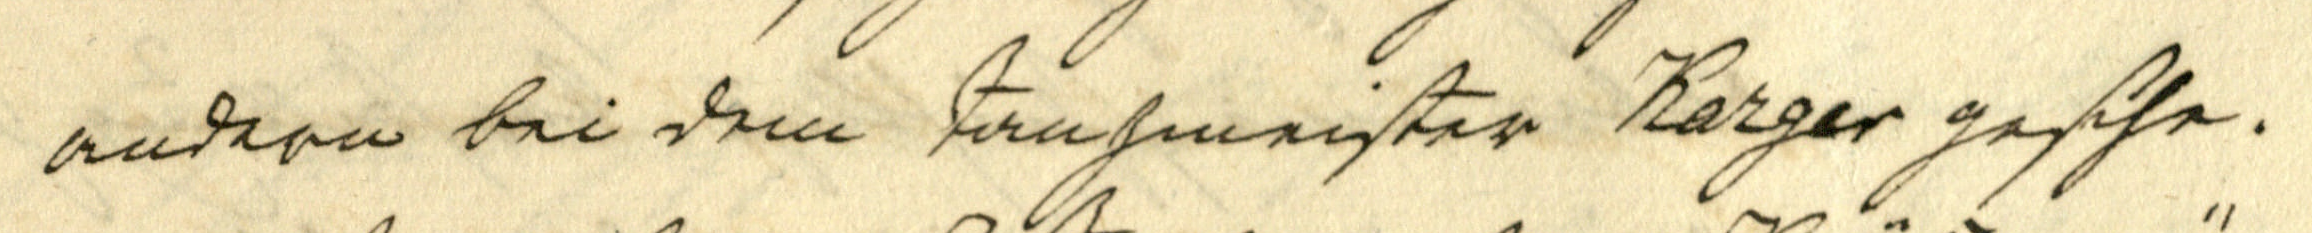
andern bei dem Tanzmeister Karger gesche¬
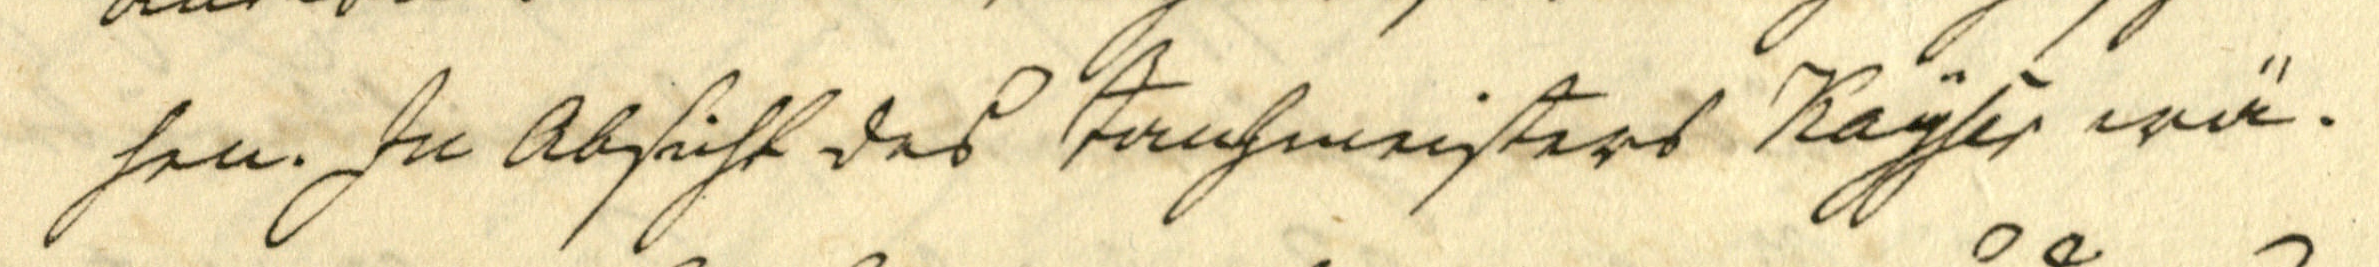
hen. In Absicht des Tanzmeisters Kaÿser wä¬
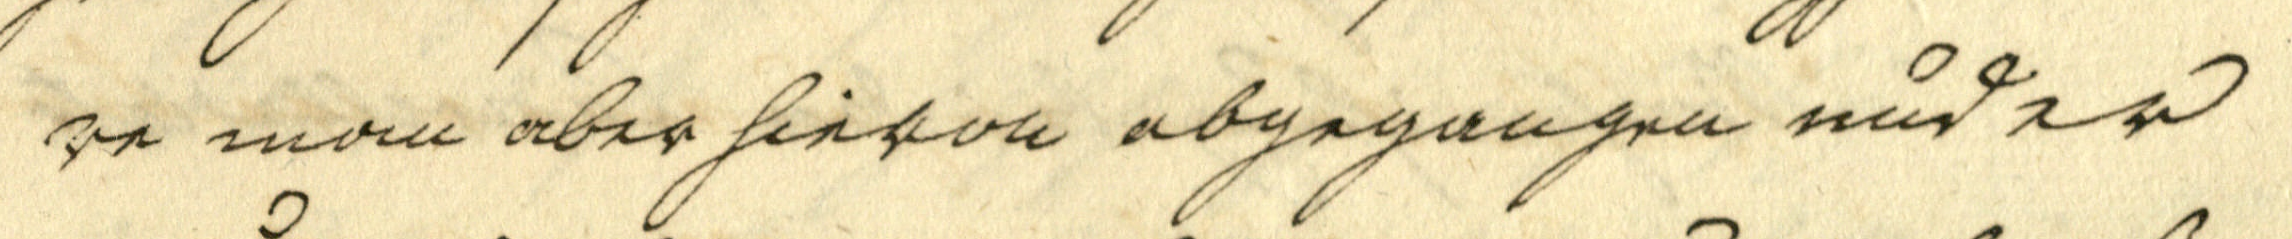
re man aber hievon abgegangen und er
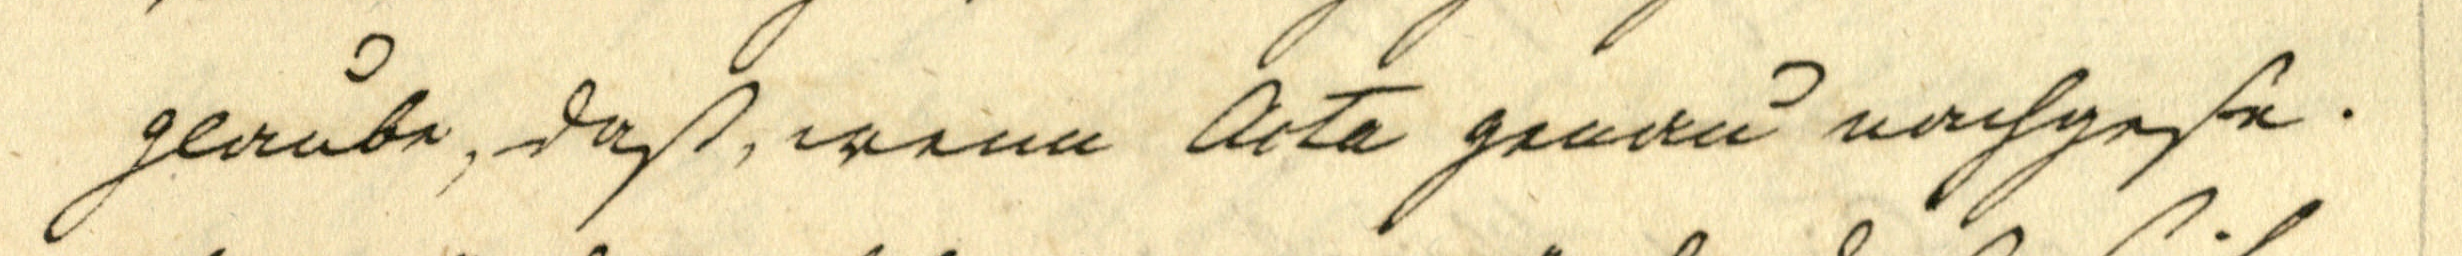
glaube, daß, wenn Acta genau nachgese¬
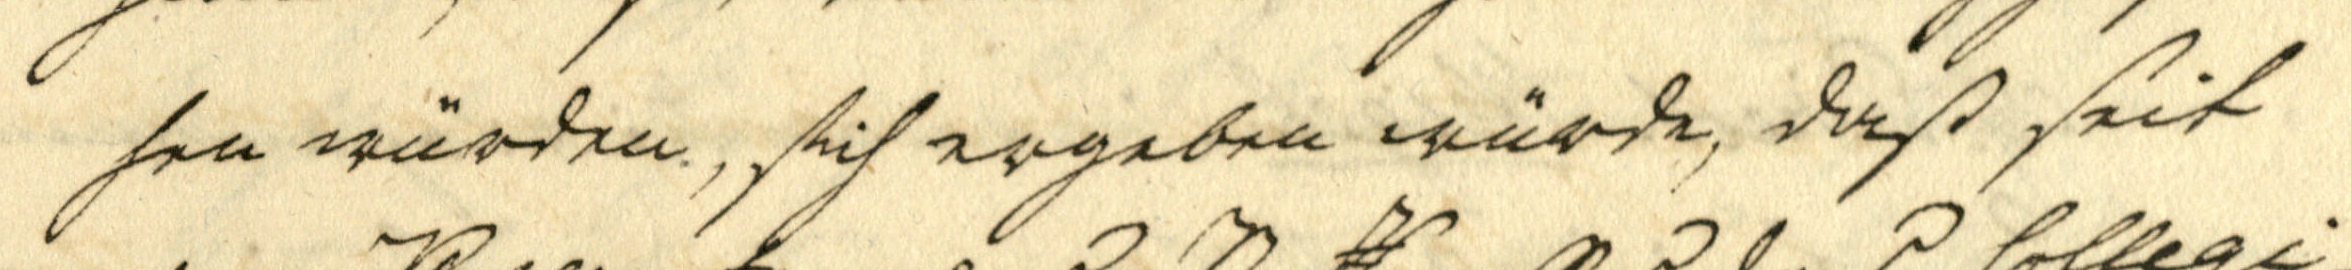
hen würden, sich ergeben würde, daß seit
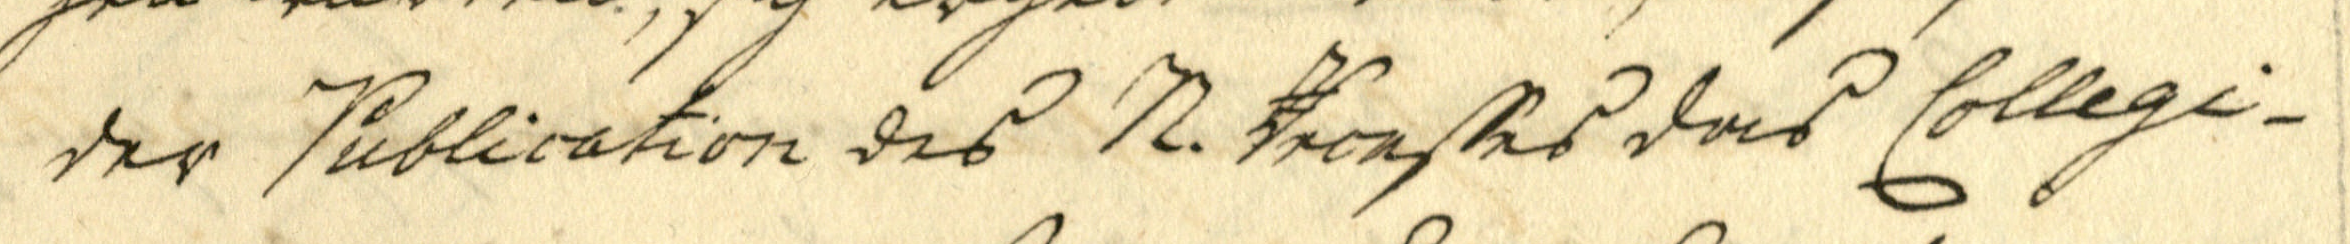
der Publication des N. Recesses das Collegi¬
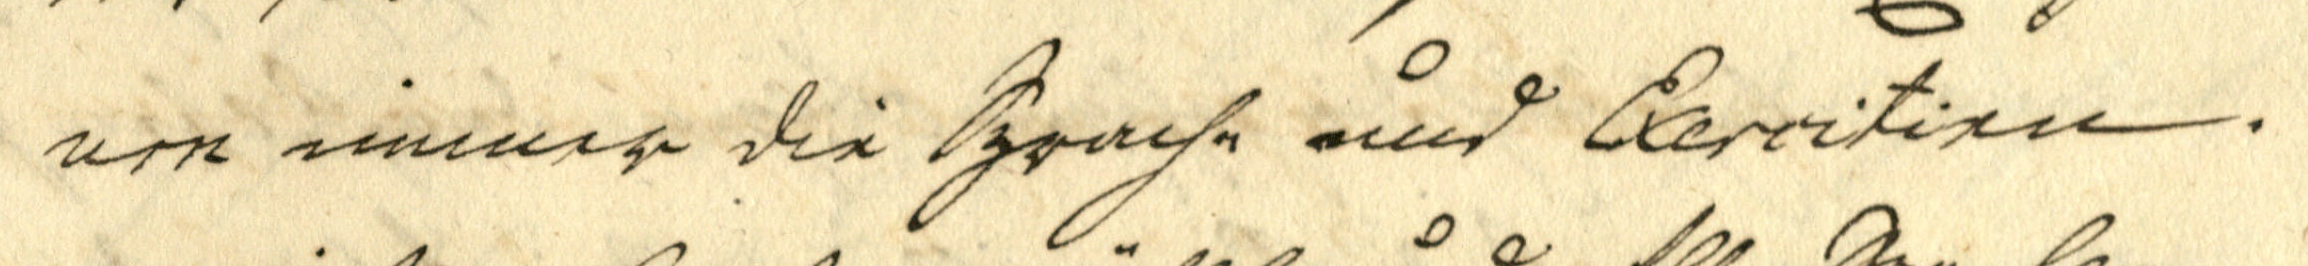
um immer die Sprach- und Exercitien¬
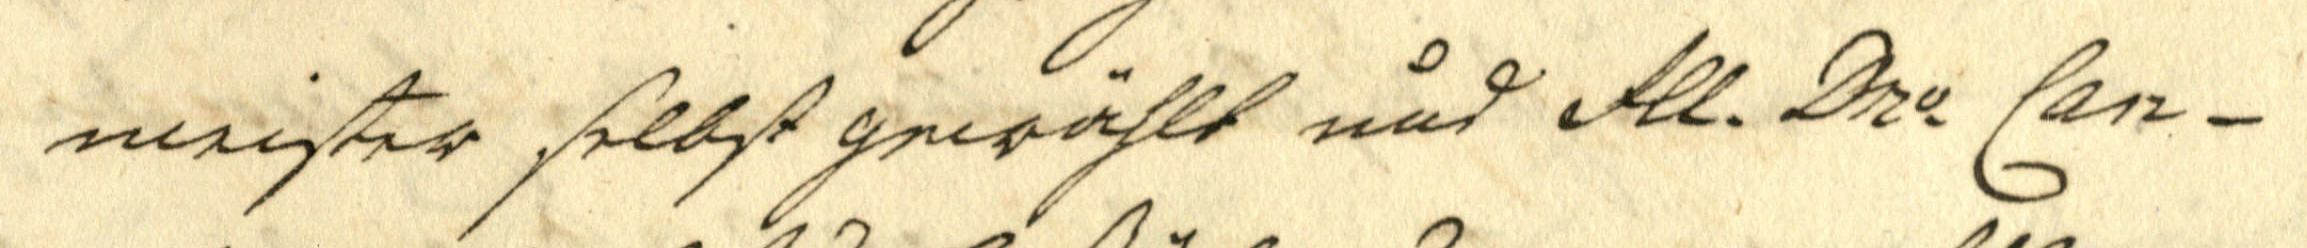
meister selbst gewählt und Ill. Dn Can¬
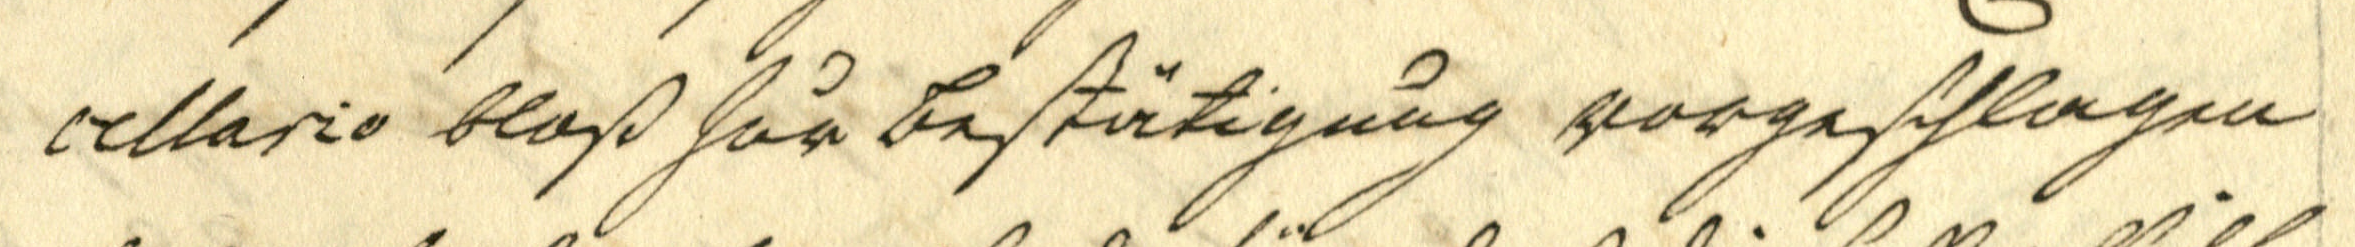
cellario bloß zur Bestätigung vorgeschlagen
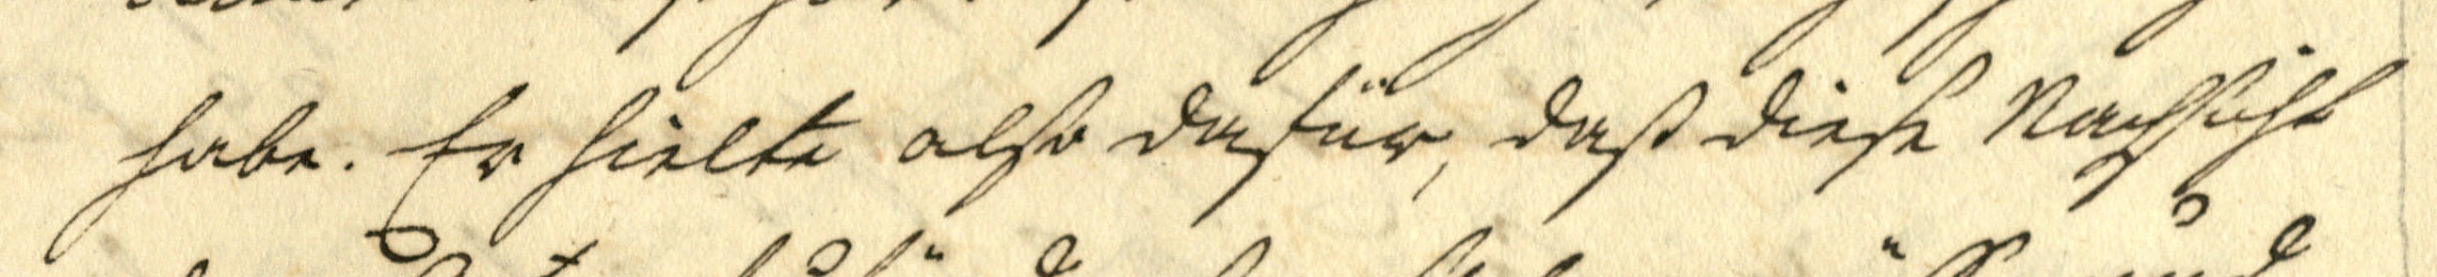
habe. Er hielte also dafür, daß diese Nachsicht
